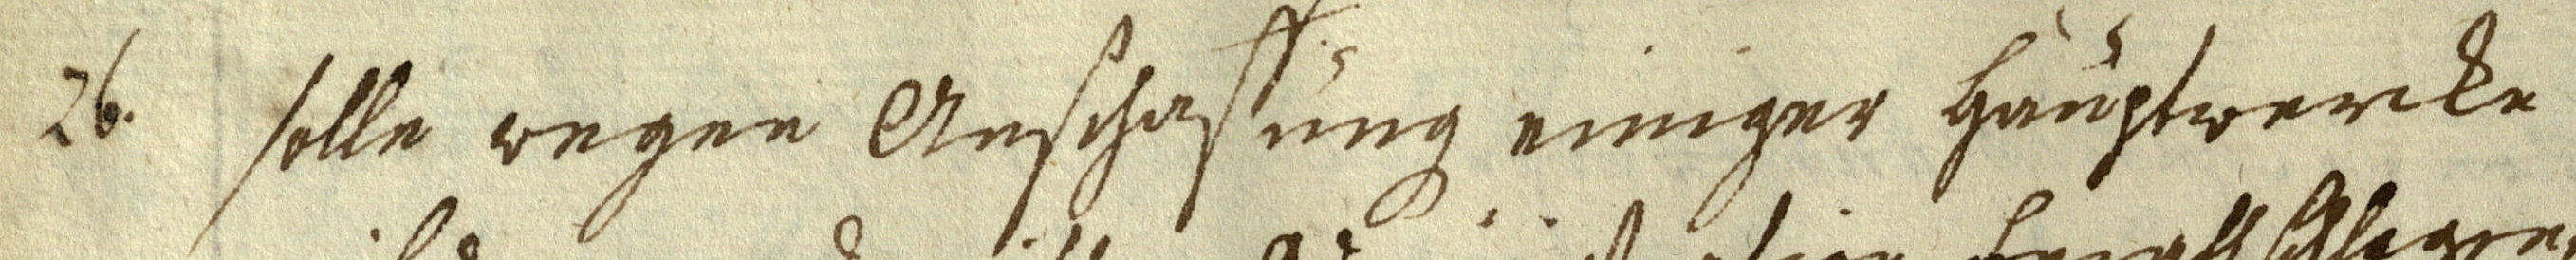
solle wegen Anschaffung einiger Hauptwercke
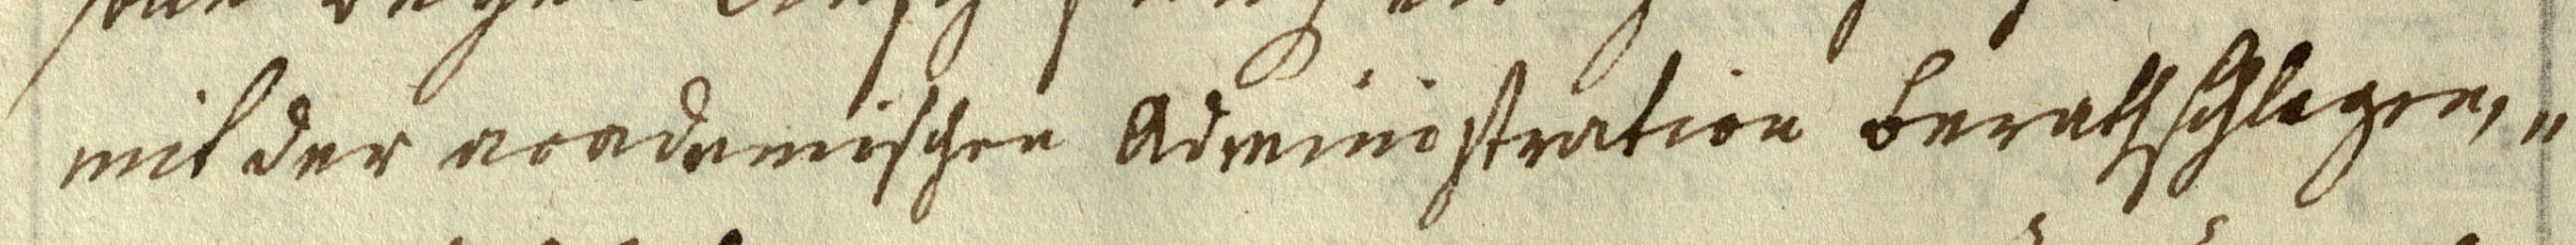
mit der academischen Administration berathschlagen, "
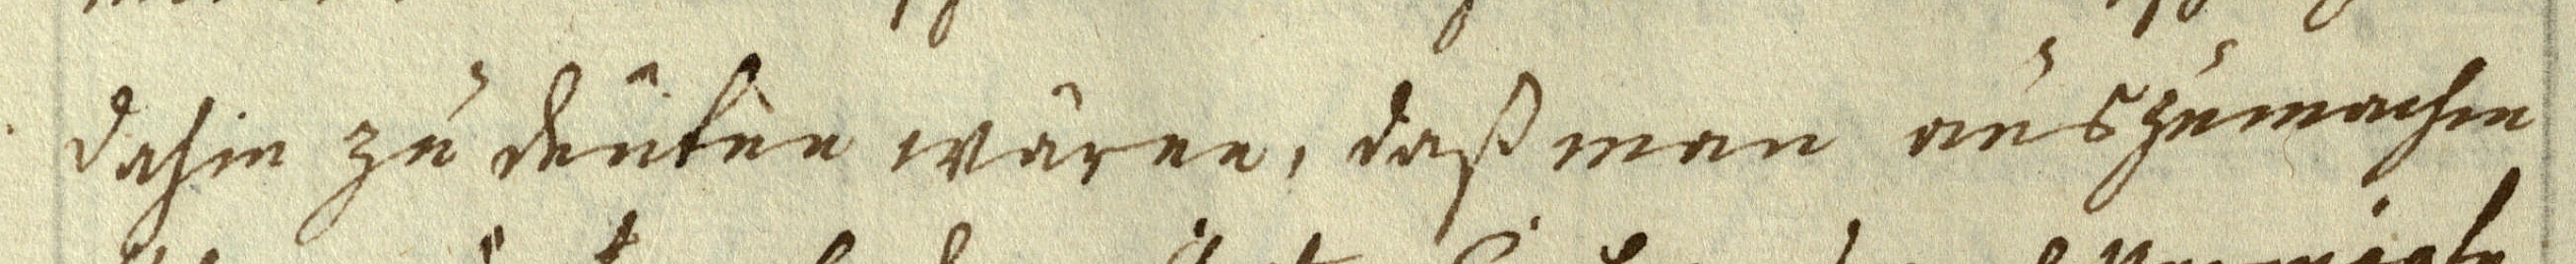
dahin zu deuten wären, daß man auszumachen
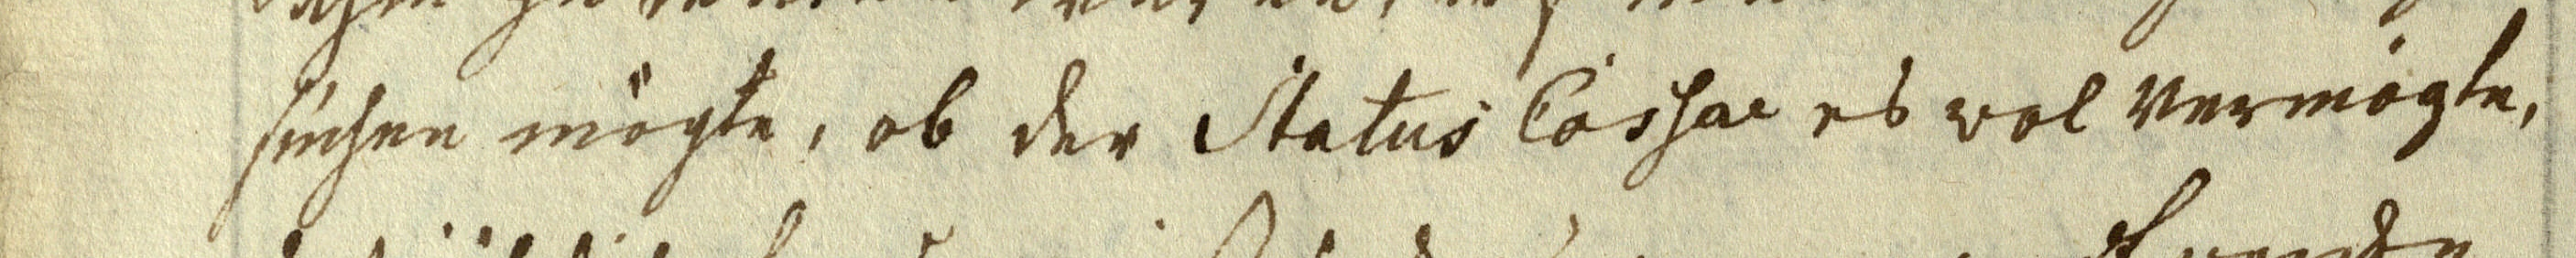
suchen mögte, ob der Status Cassae es wol vermögte,
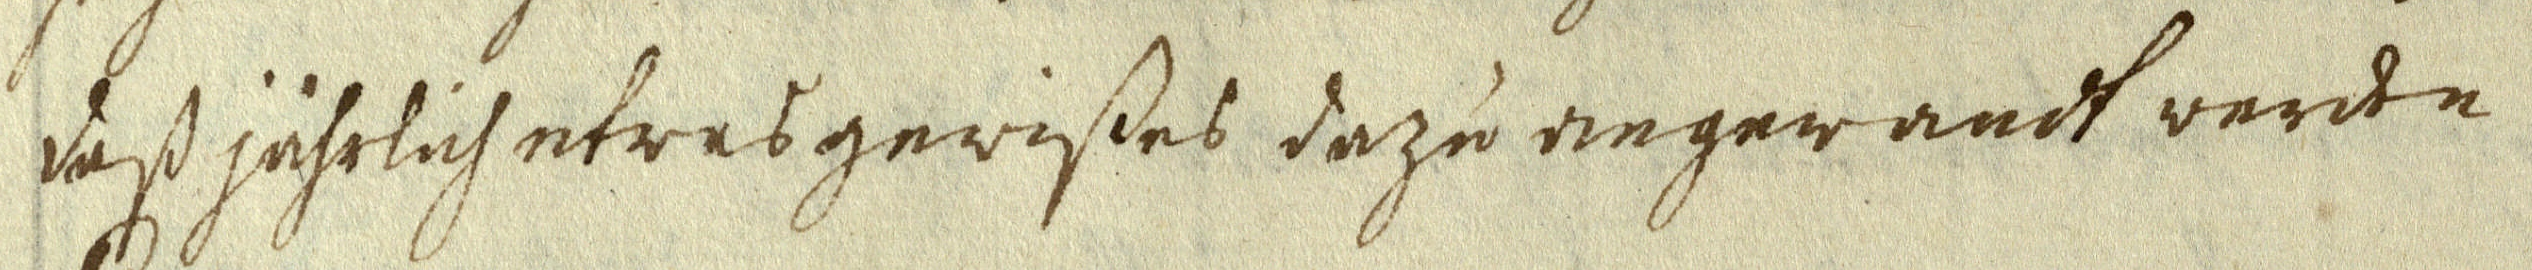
daß jährlich etwas gewißes dazu angewandt werden
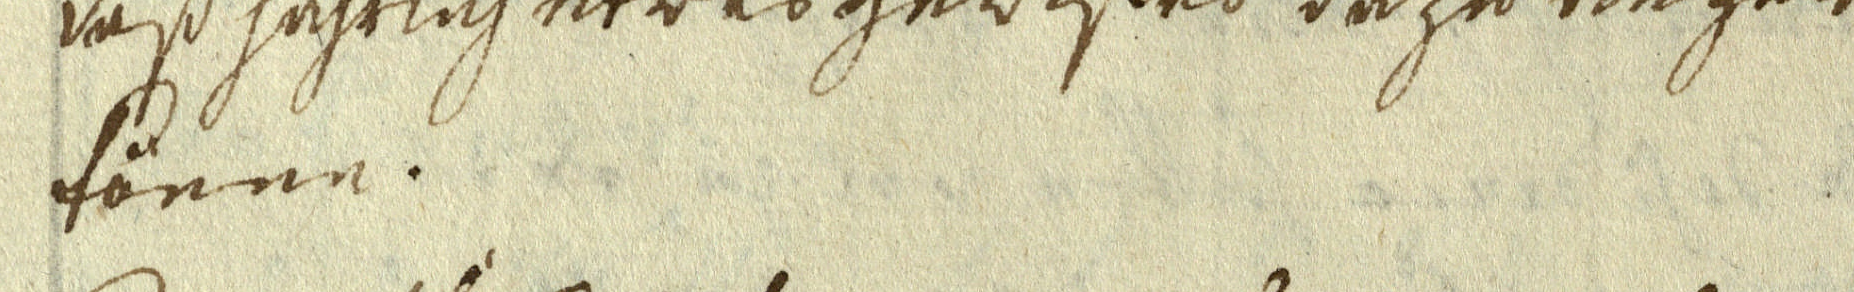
könne.
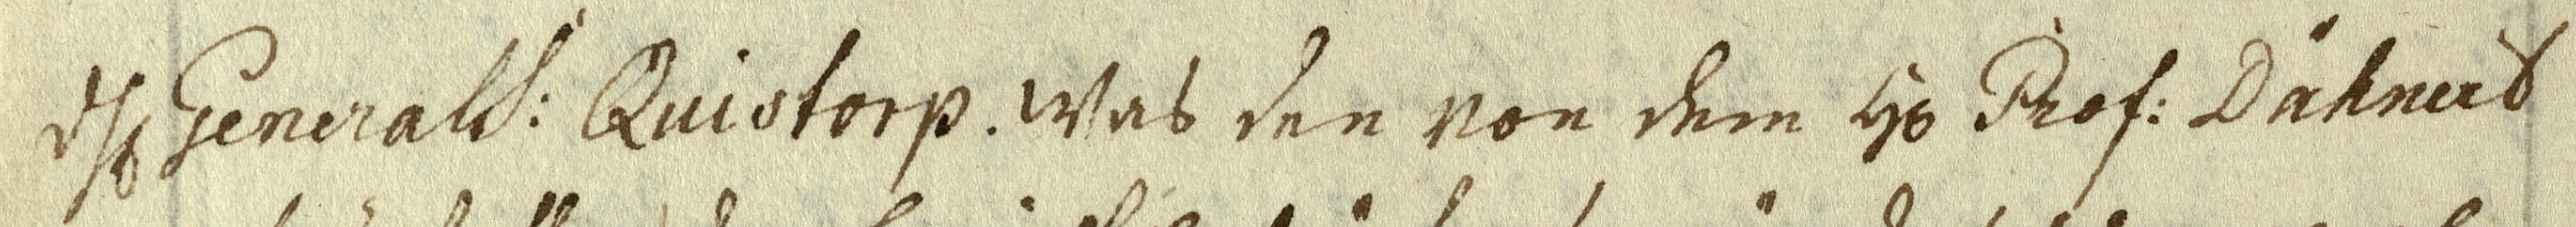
dh GeneralS: Quistorp. Was den von dem H Prof. Dähnert
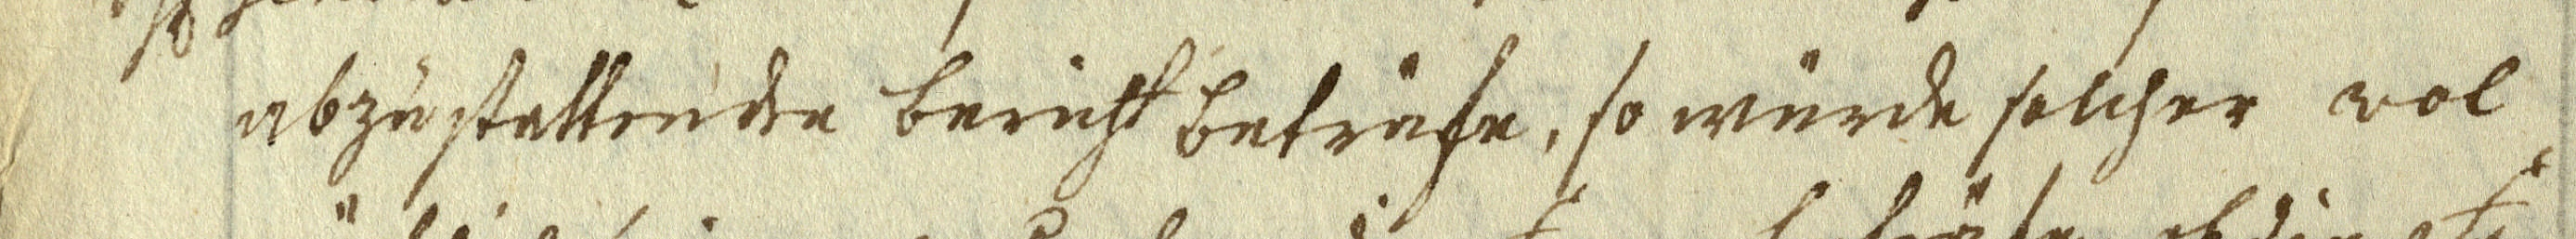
abzustattenden Bericht beträfe, so würde solcher wol
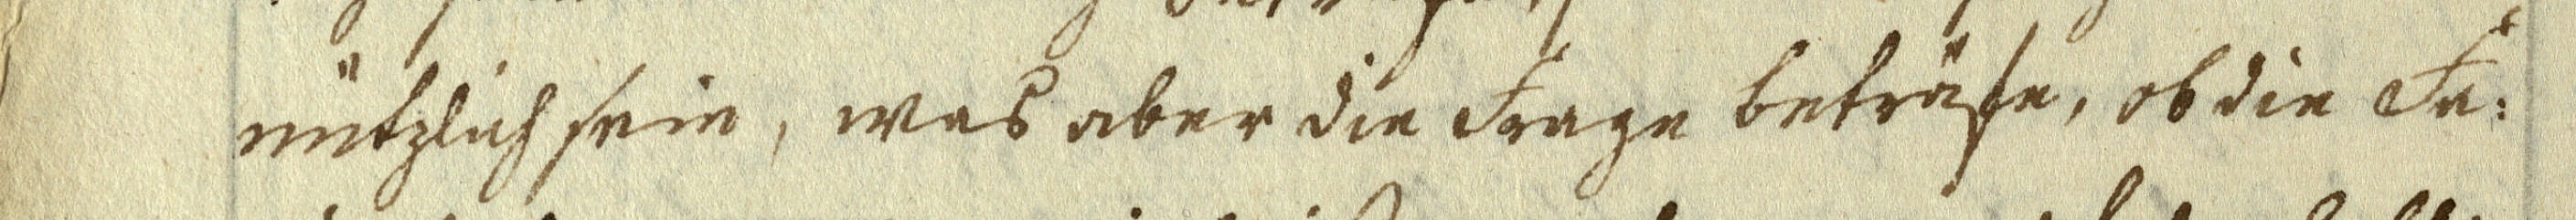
nützlich sein, was aber die Frage beträfe, ob die Fa¬
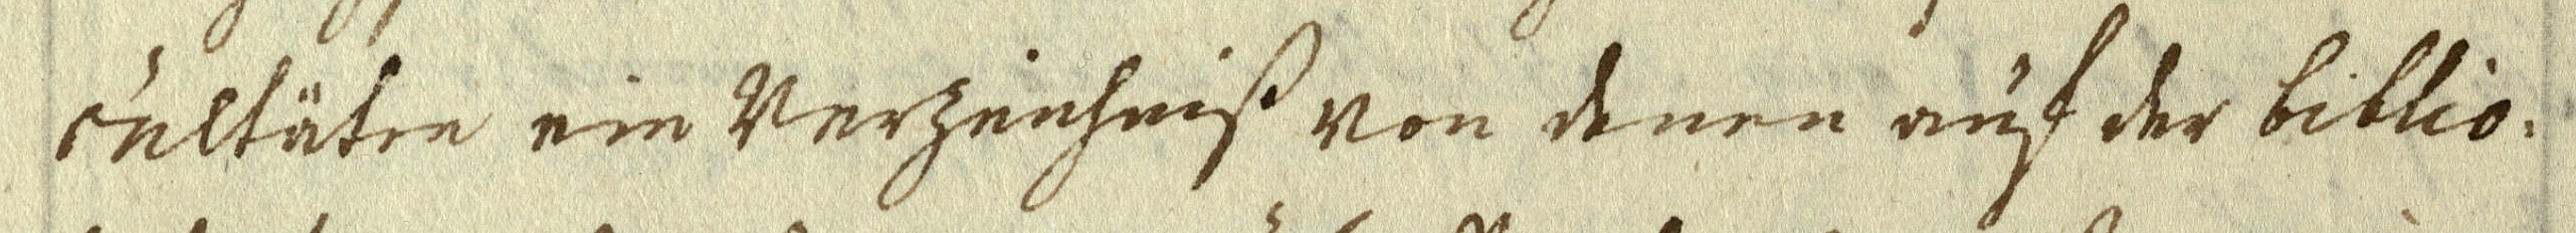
cultäten ein Verzeichniß von denen auf der biblio¬
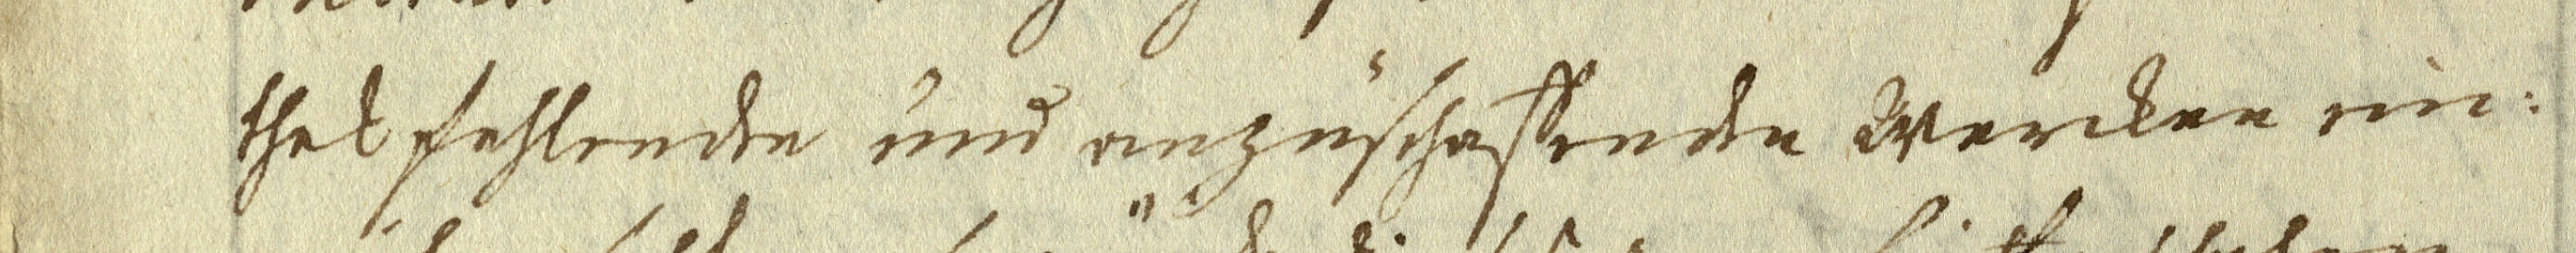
thek fehlenden und anzuschaffenden Wercken ein¬
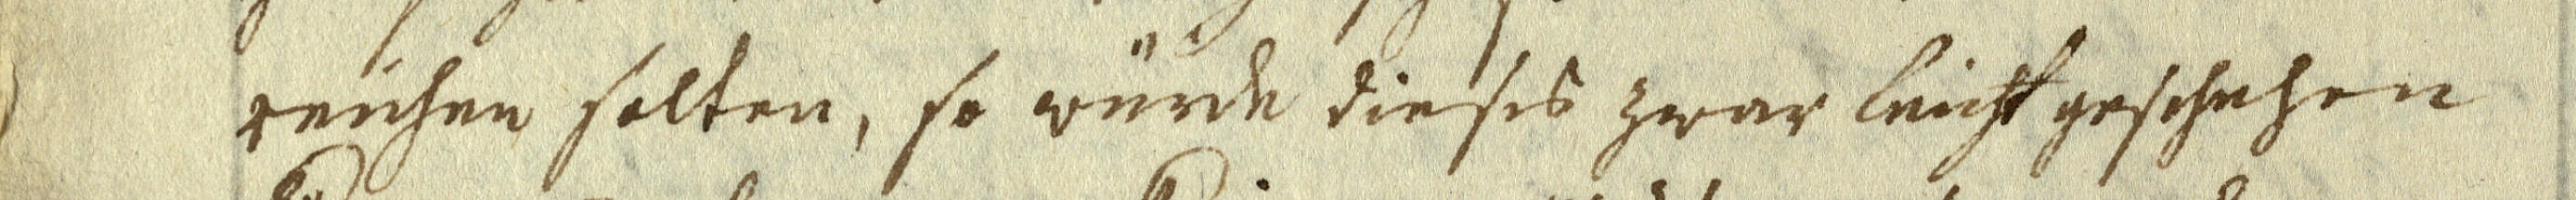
reichen solten, so würde dieses zwar leicht geschehen
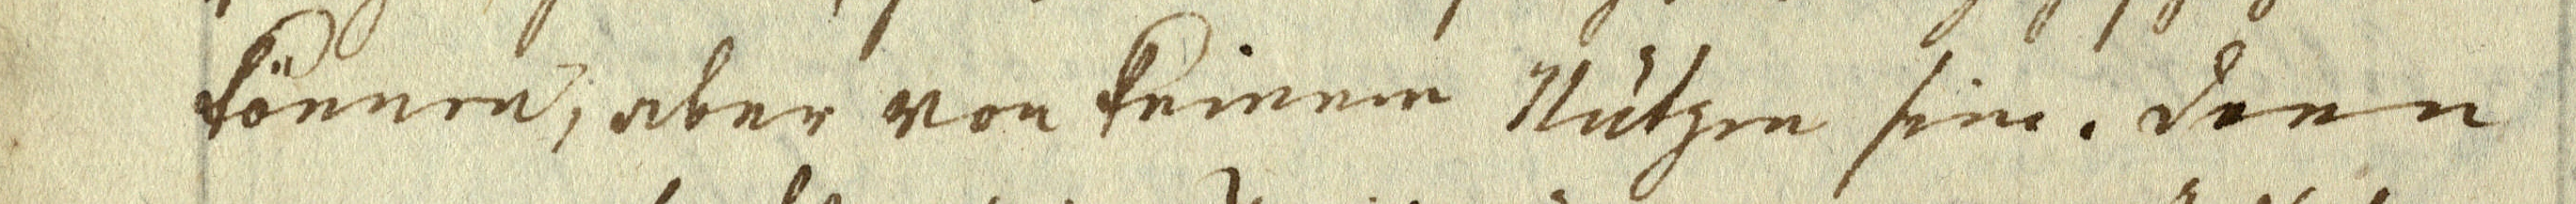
können, aber von keinem Nutzen sein, denn
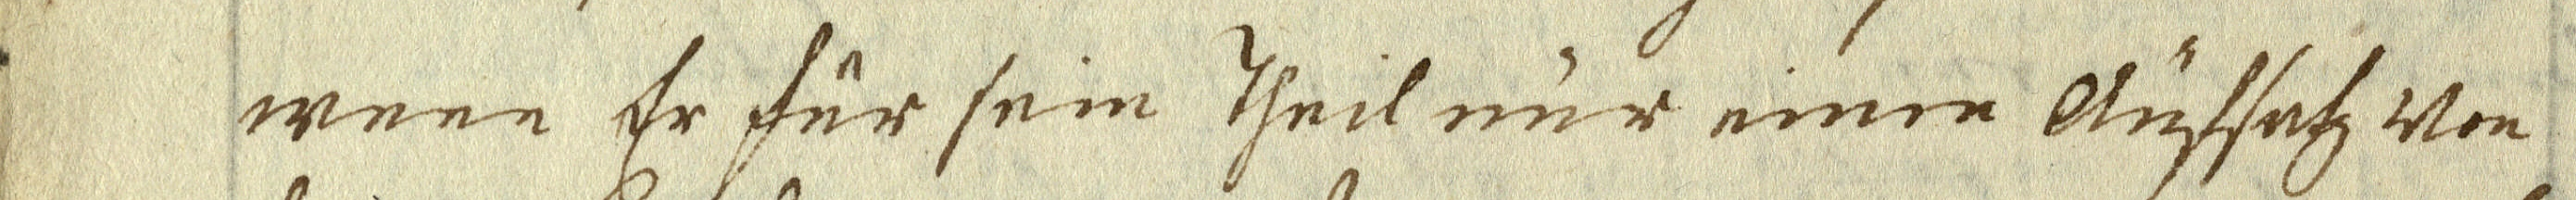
wenn Er für sein Theil nur einen Aufsatz von
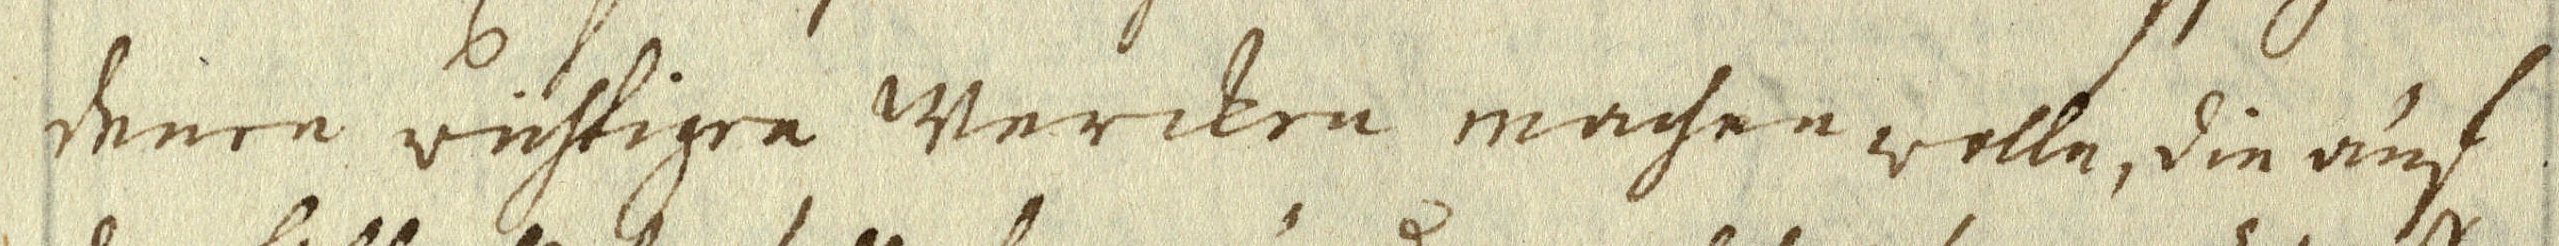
denen wichtigen Wercken machen wolle, die auf
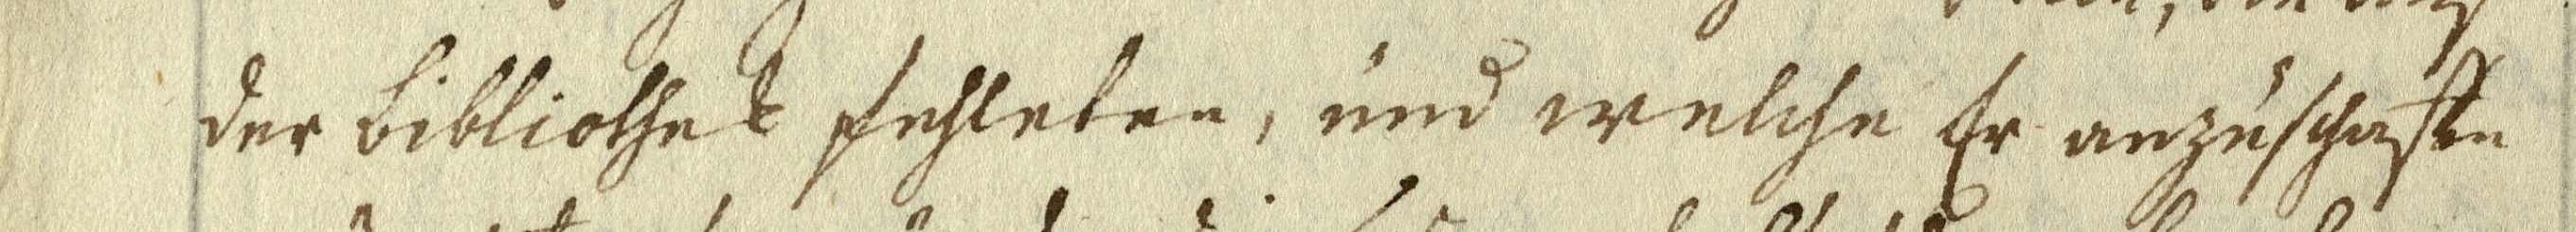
der Bibliothek fehleten, und welche Er anzuschaffen
